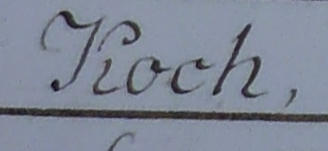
Koch,
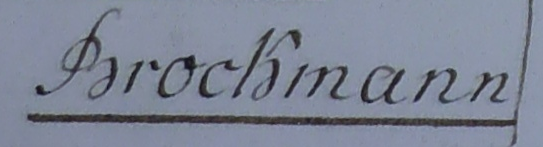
Brockmann
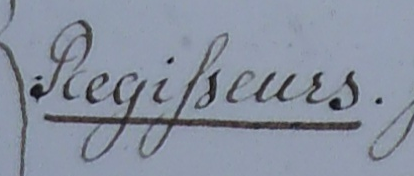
Regisseurs.
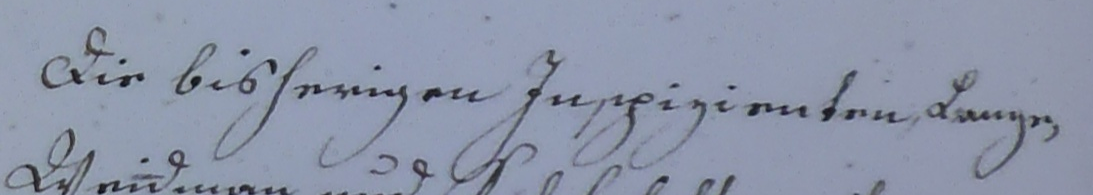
Die bisherigen Inspizienten Lange,
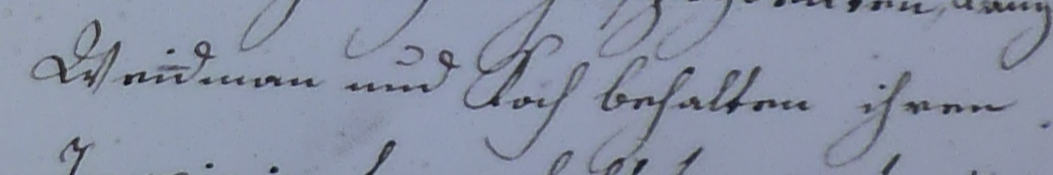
Weidman und Koch behalten ihren
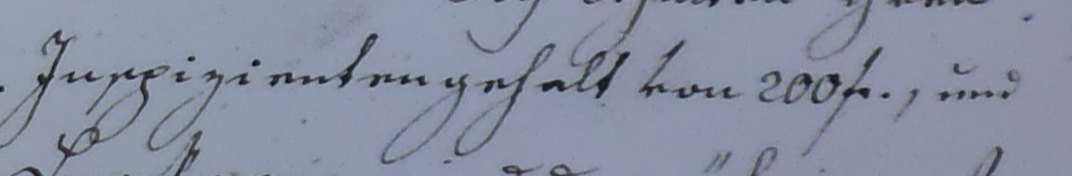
Inspizientengehalt von 200fr., und
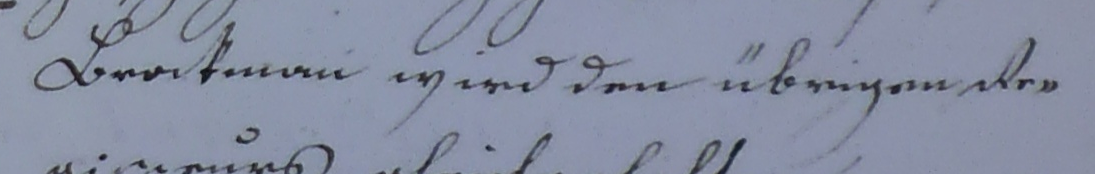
Brockman wird den übrigen Re¬
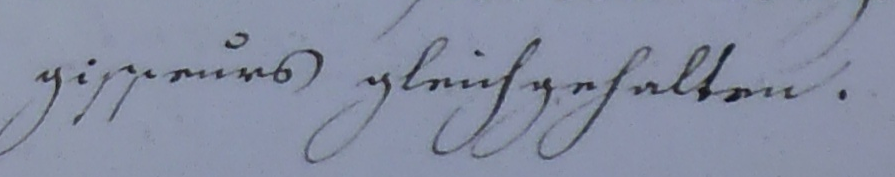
gisseurs gleichgehalten.
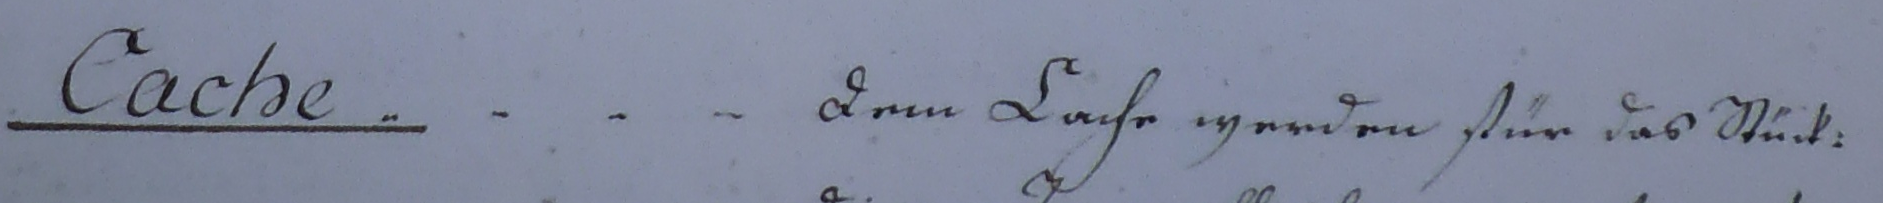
Cache .. .. .. .. Dem Cache werden für das Stück:
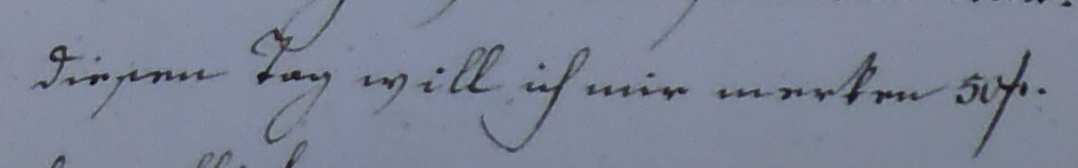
diesen Tag will ich mir merken 50fr.
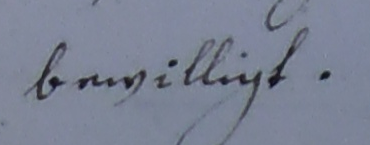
bewilligt.
